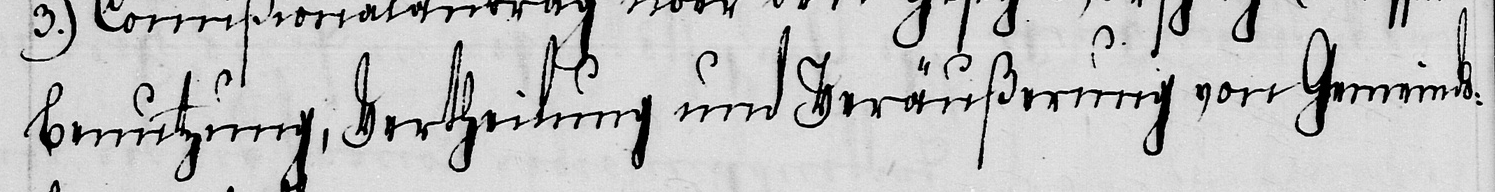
Benutzung, Vertheilung und Veräußerung von Gemeinds¬
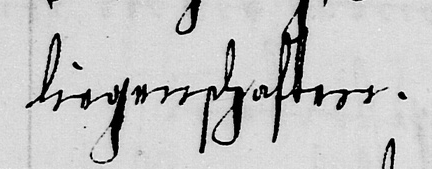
liegenschaften.
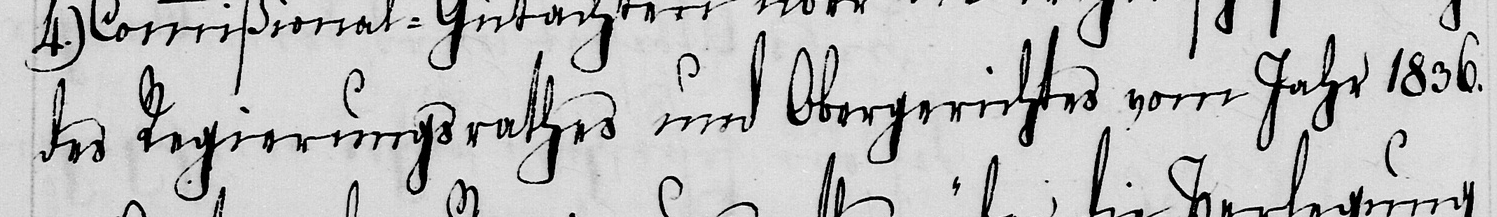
des Regierungsrathes und Obergerichtes vom Jahr 1836.
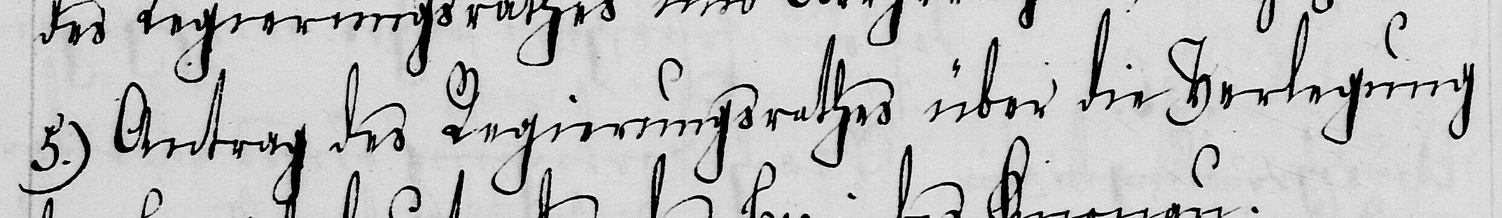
5.) Antrag des Regierungsrathes über die Verlegung
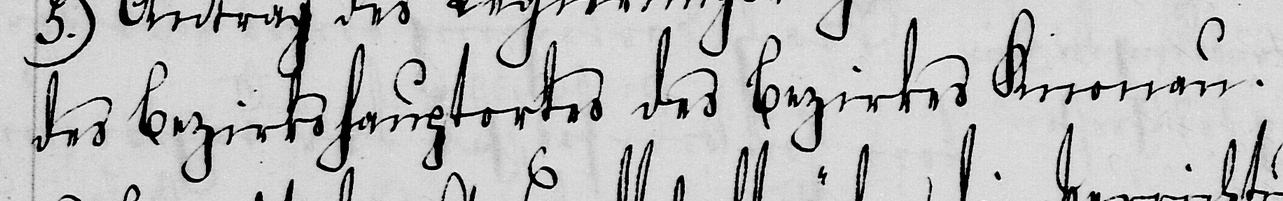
des Bezirkshauptortes des Bezirkes Knonau.
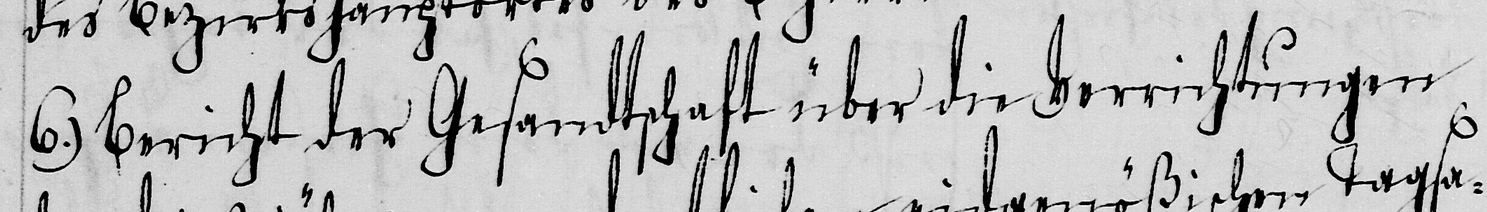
6.) Bericht der Gesandtschaft über die Verrichtungen
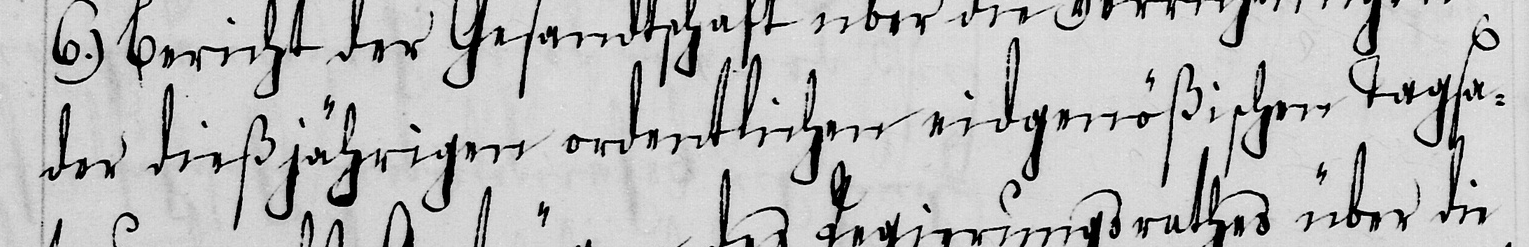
der dießjährigen ordentlichen eidgenößischen Tagsa¬
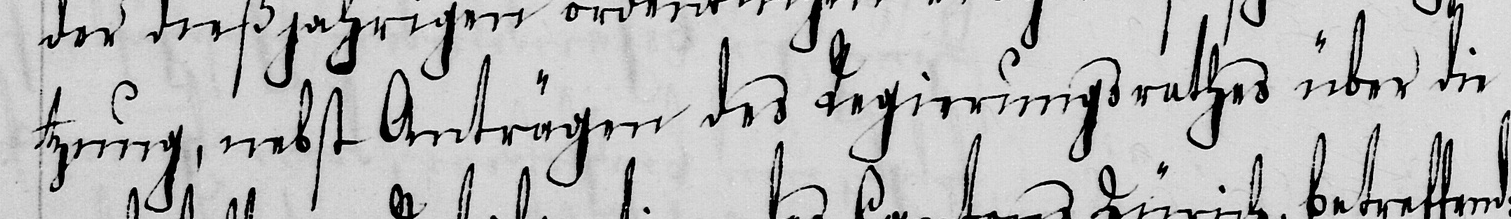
tzung, nebst Anträgen des Regierungsrathes über die
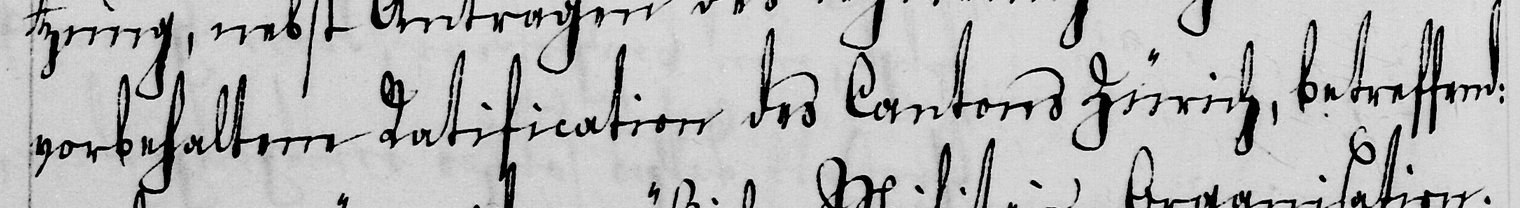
vorbehaltene Ratification des Cantons Zürich, betreffe¬
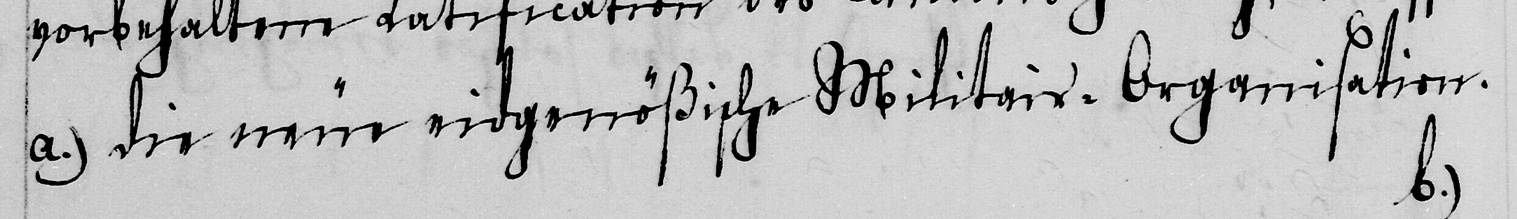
a.) die neue eidgenößische Militair-Organisation.
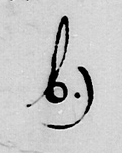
4.)
